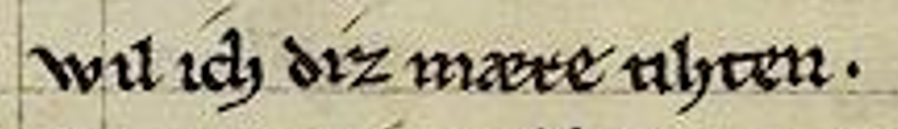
Wil ich diz m[ae]re tihten.
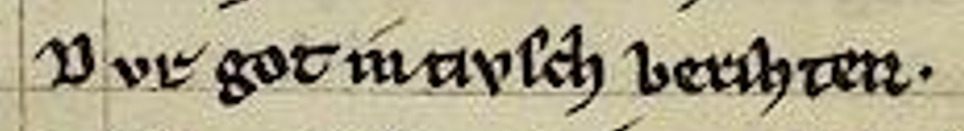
Dvr got in tivſch berihten.
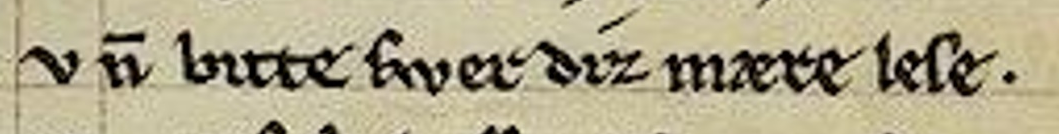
Vn(d) bitte ſwer diz m[ae]re leſe.
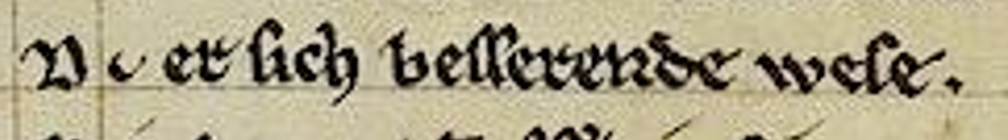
D(az) er ſich beſſernde weſe.
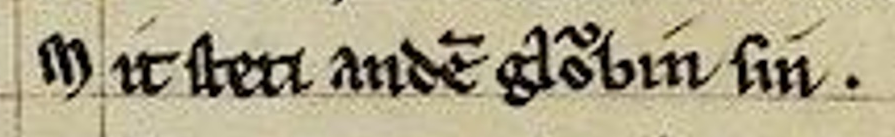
Mit ſteti ande(n) glo°vbin ſin.
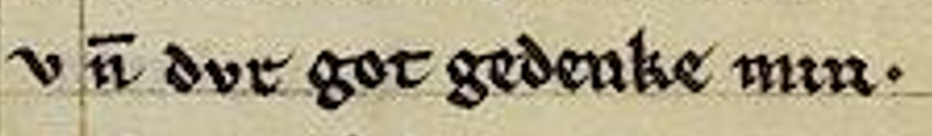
Vn(d) dvr got gedenke min.
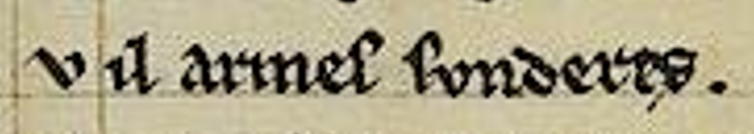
Vil armeſ ſvnderes.
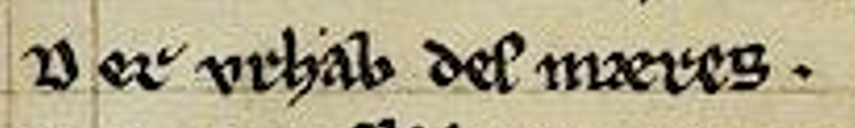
Der vrhab deſ m[ae]res.
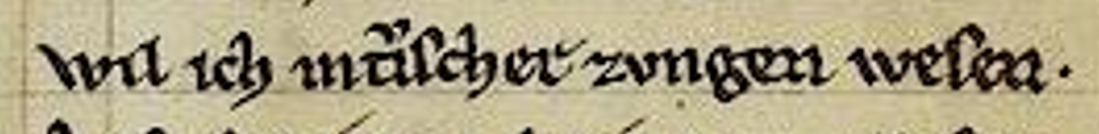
Wil ich inti°vſcher zvngen weſen.
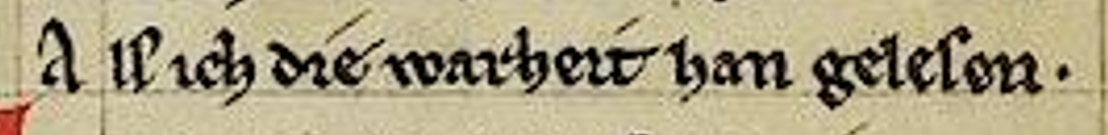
Alſ ich die warheit han geleſen.
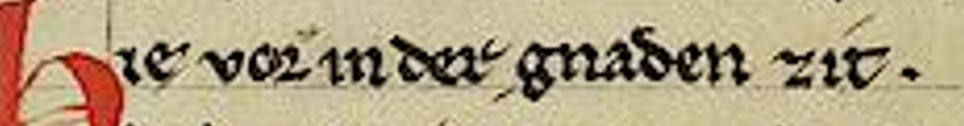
**Hie vor in der gnaden zit.
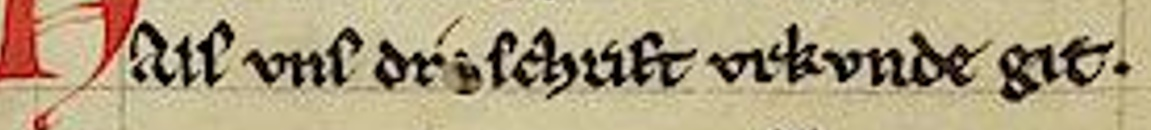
Alſ vnſ div ſchrift vrkvnde git.
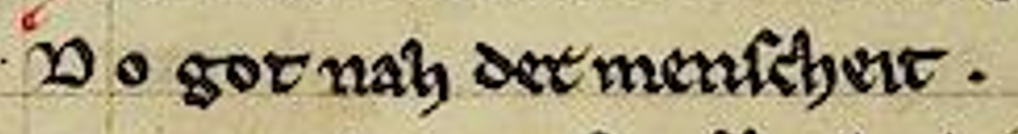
Do got nah der menſcheit.
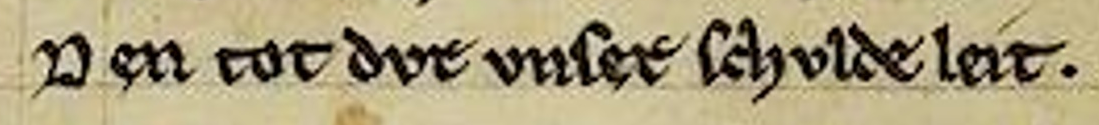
Den tot dvr vnſer ſchvlde leit.
